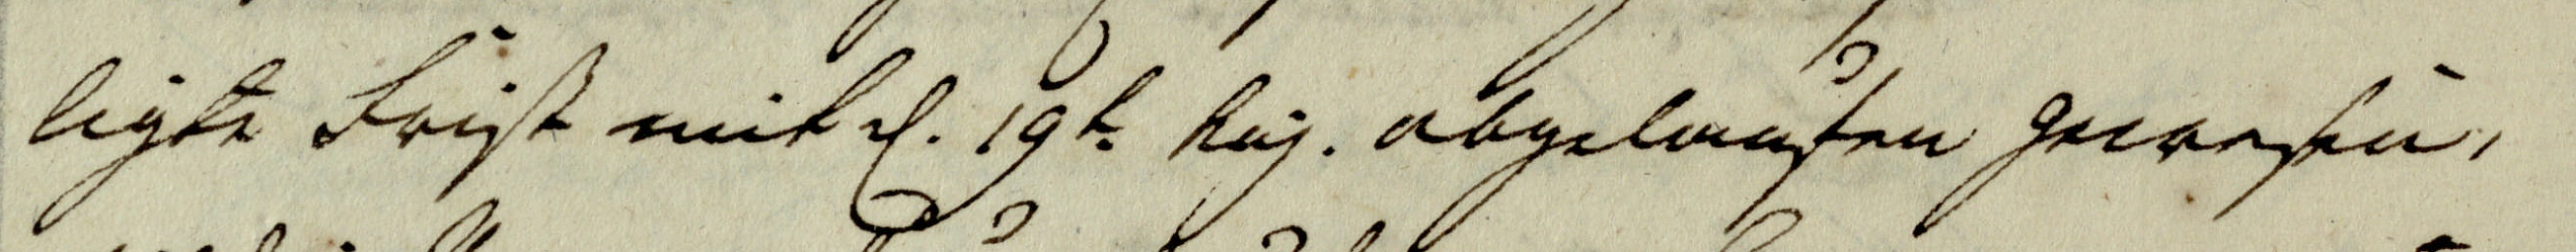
ligte Frist mit d. 19 t. huj. abgelaufen gewesen,
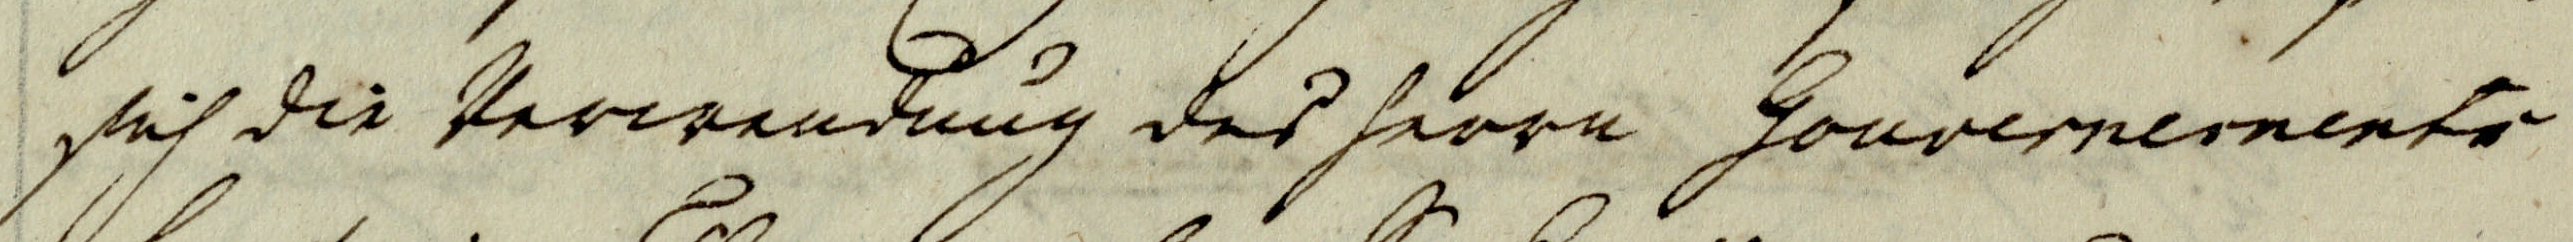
sich die Verwendung des Herrn Gouvernements
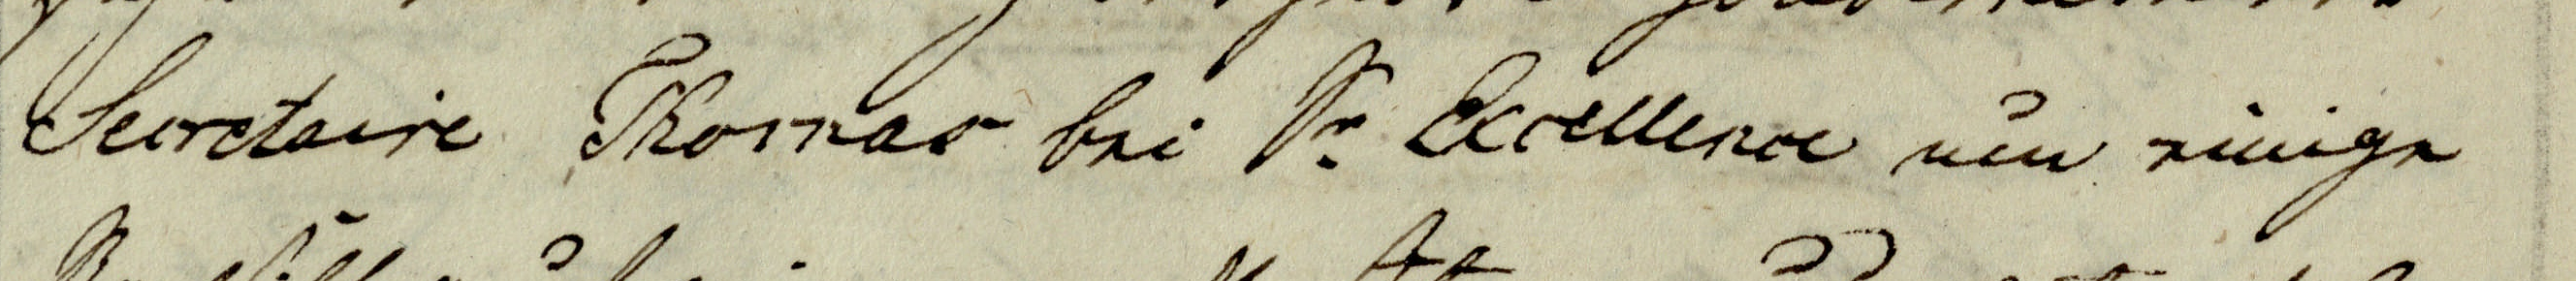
Secretaire Thomas bei Sr Excellence um einige
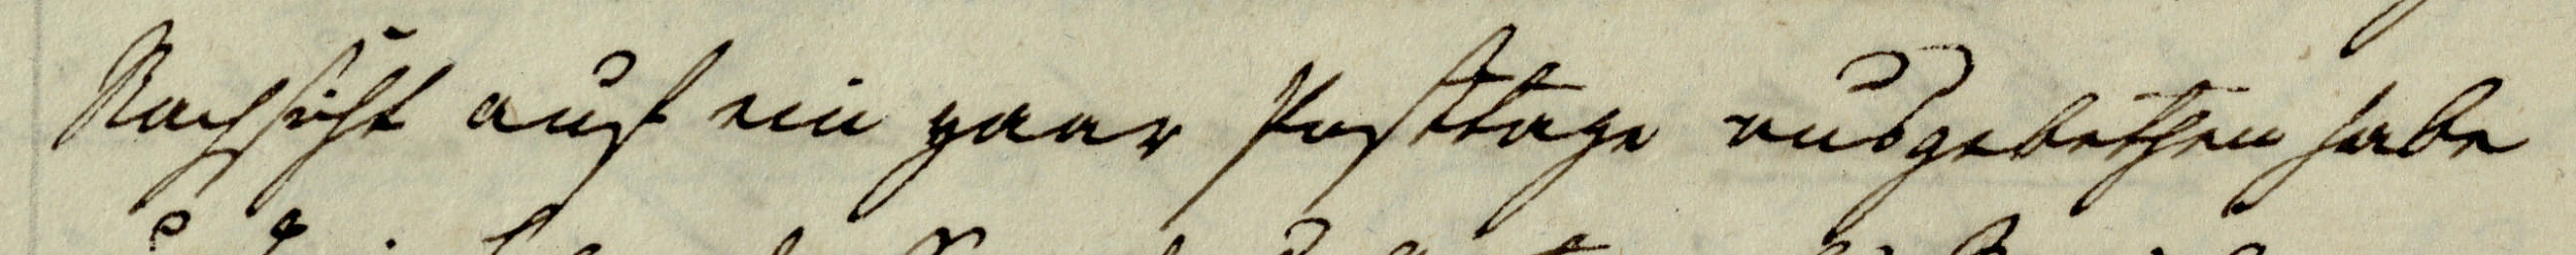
Nachsicht auf ein paar Posttage ausgebethen habe
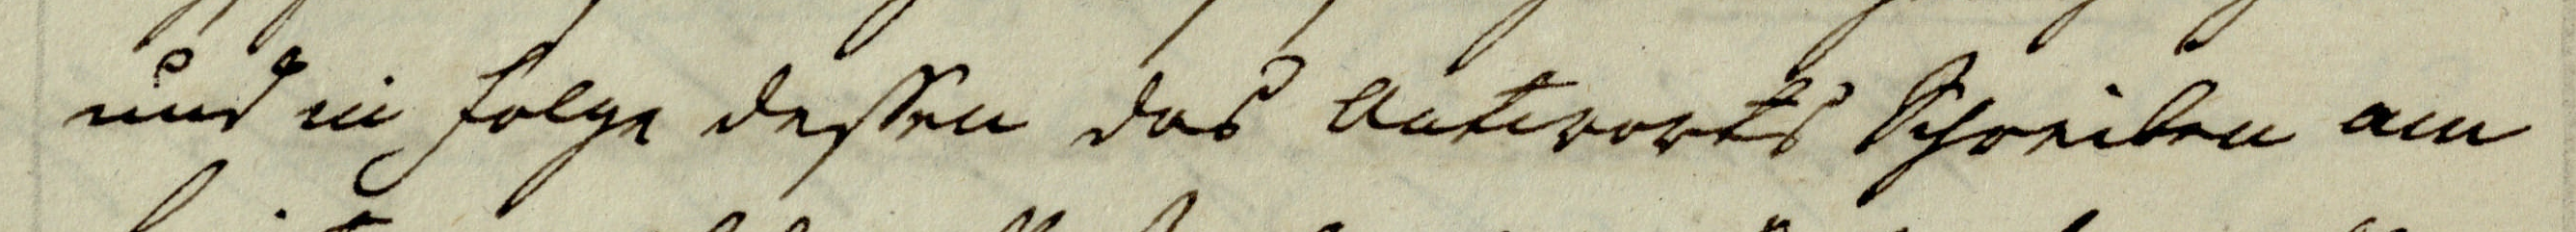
und in Folge dessen das Antworts Schreiben am
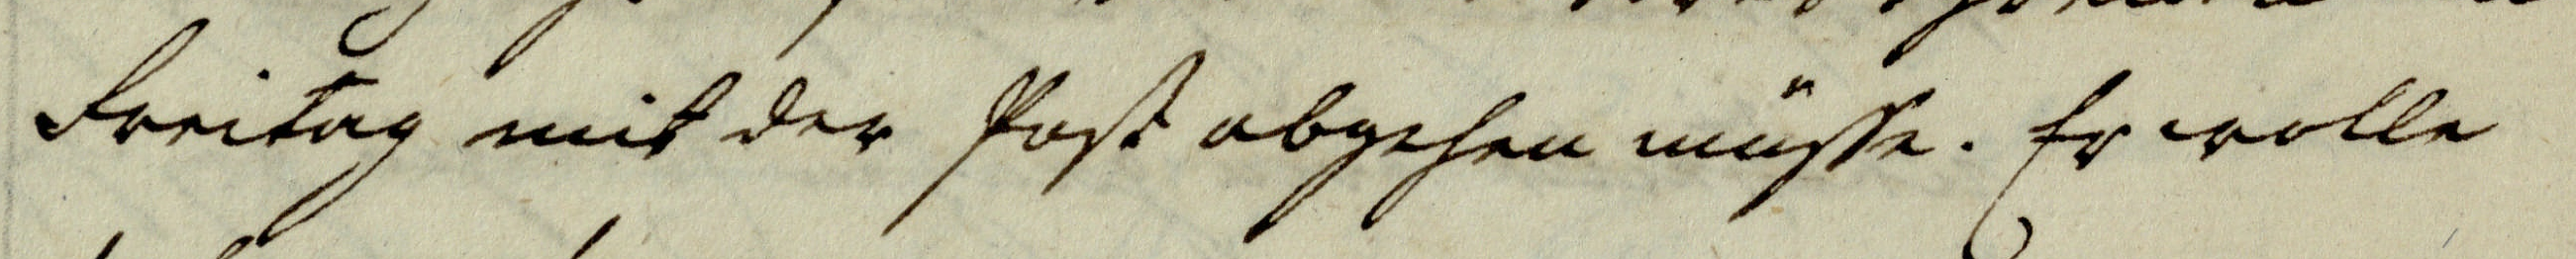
Freitag mit der Post abgehen müsse. Er wolle
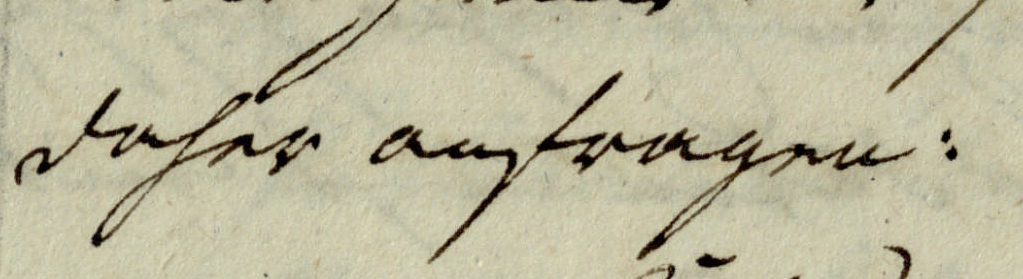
daher anfragen:
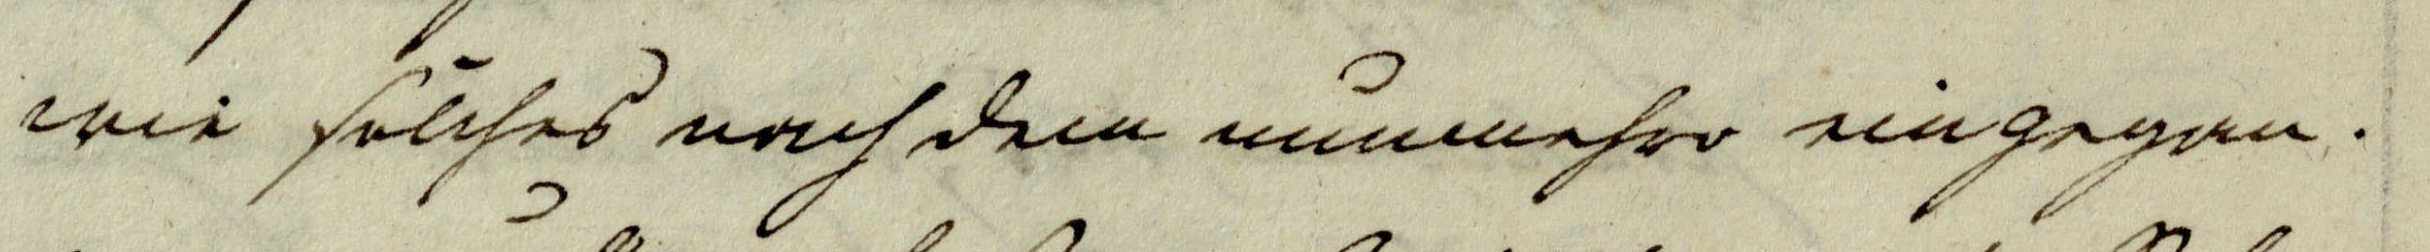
wie solches nach dem nunmehro eingegan¬
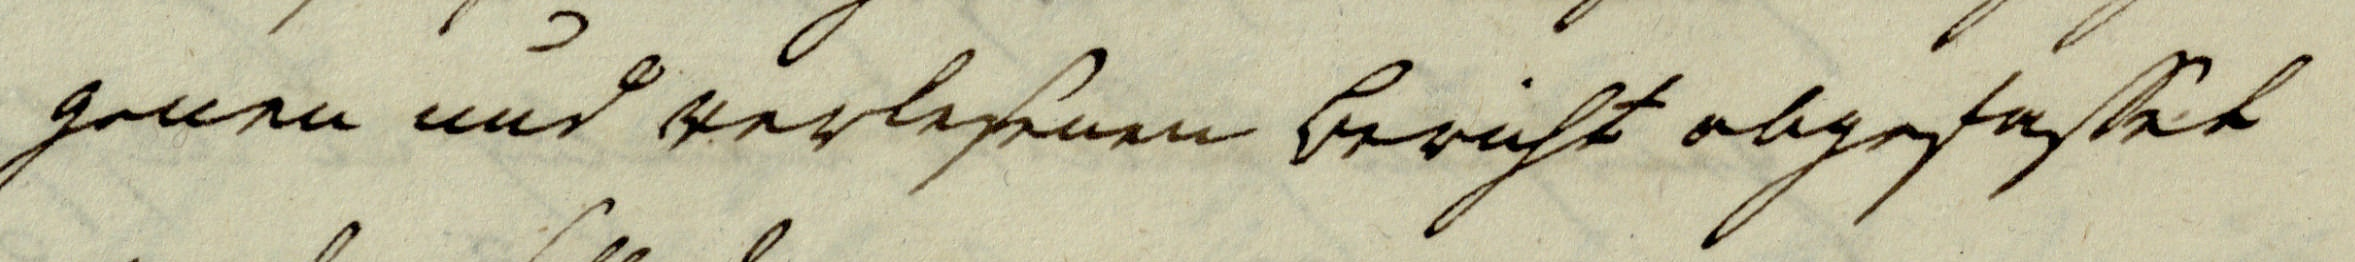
genen und verlesenen Bericht abgefasset
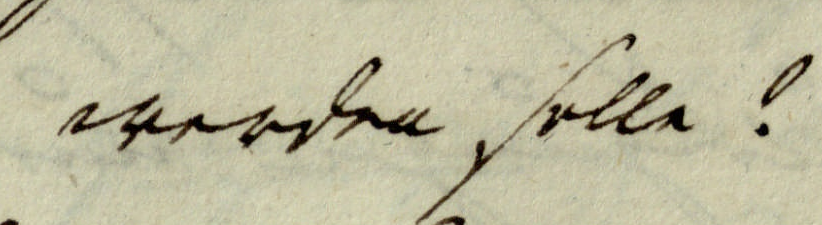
werden solle?
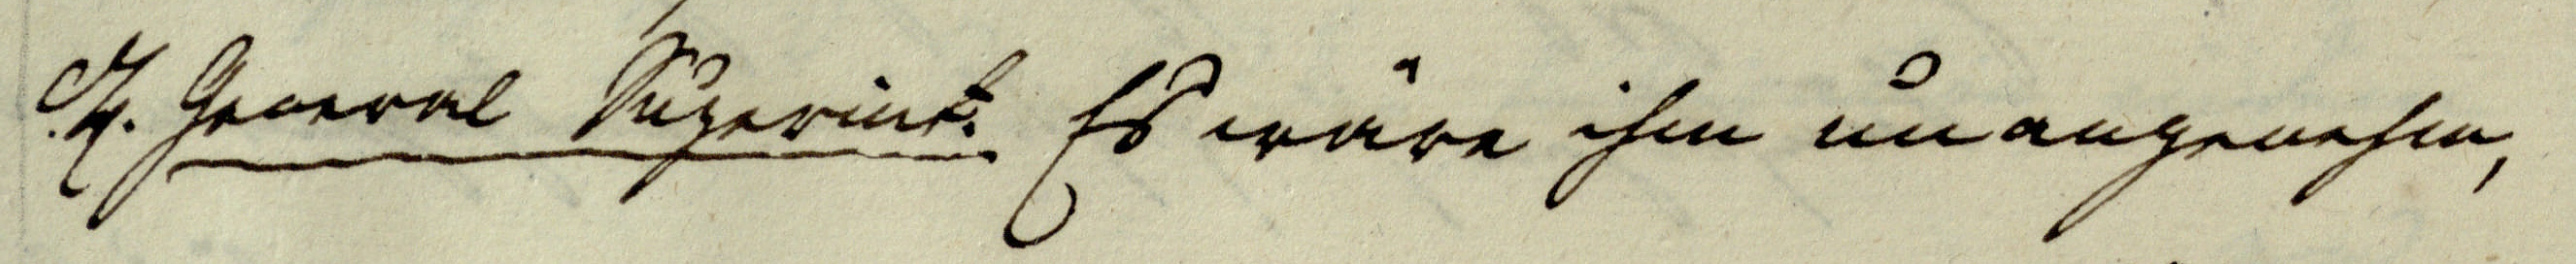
dh. General Superint. Es wäre ihm unangenehm,
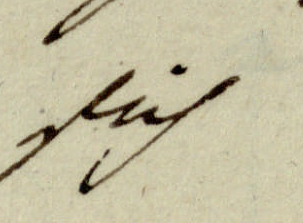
sich
